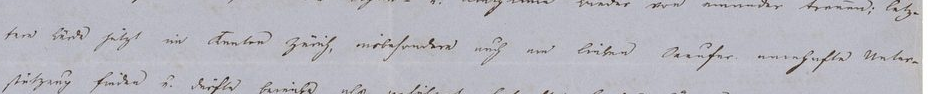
tere würde jetzt im Kanton Zürich, insbesondere auch am linken Seeufer namhafte Unter-
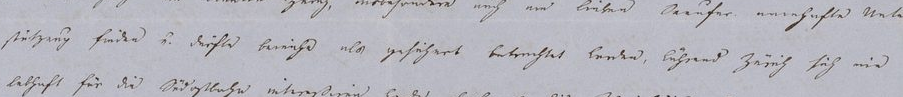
stützung finden u. dürfte beinahe als gesichert betrachtet werden, während Zürich sich nie
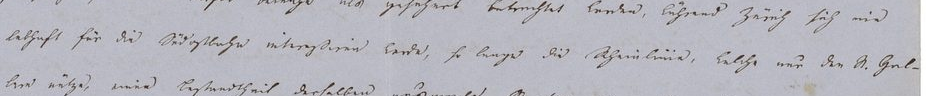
lebhaft für die Südostbahn interessiren werde, so lange die Rheinlinie, welche nur den St. Gal-
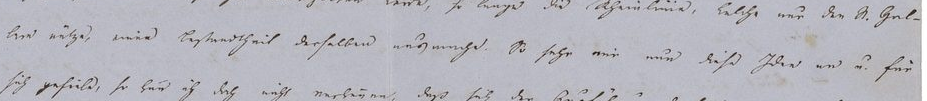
lern nütze, einen Bestandtheil derselben ausmache. So sehr mir nun diese Idee an u. für
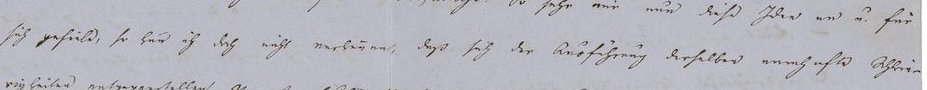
sich gefiele, so kann ich doch nicht verkennen, daß sich der Ausführung derselben namhafte Schwie-
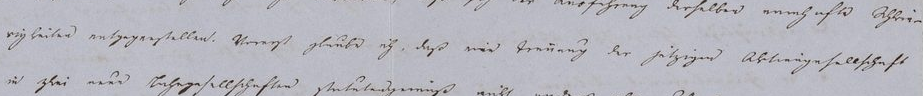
rigkeiten entgegenstellen. Vorerst glaube ich, daß eine Trennung der jetzigen Aktiengesellschaft
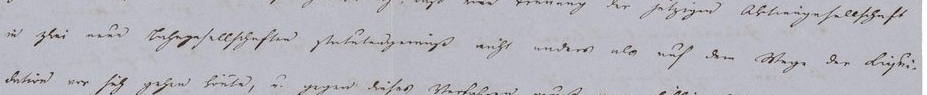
in zwei neue Bahngesellschaften statutengemäß nicht anders als auf dem Wege der Liqui-
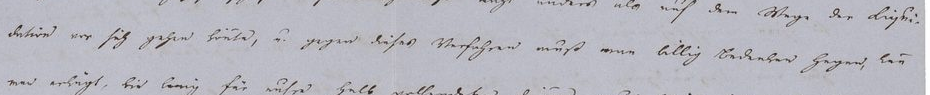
dation vor sich gehen könnte, u. gegen dieses Verfahren muß man billig Bedenken hegen, wenn
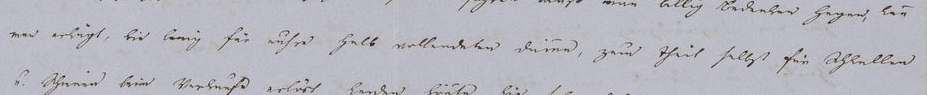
man erwägt, wie wenig für unsre halb vollendeten Dämme, zum Theil selbst für Schwellen
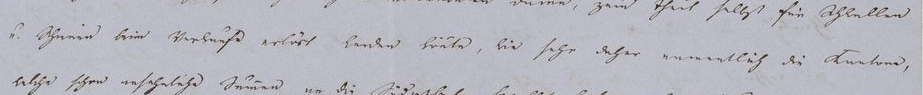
u. Schienen beim Verkaufe erlöst werden könnte, wie sehr daher namentlich die Kantone,
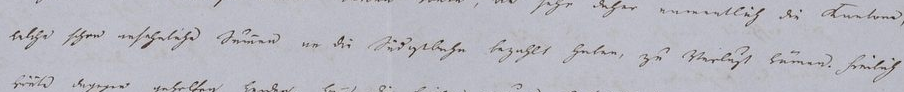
welche schon ansehnliche Summen an die Südostbahn bezahlt haben, zu Verlust kämen. Freilich
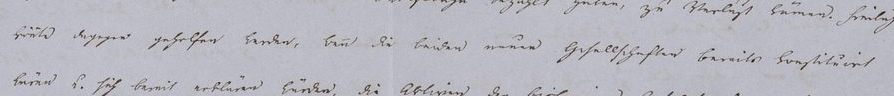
könnte dagegen gehalten werden, wenn die beiden neuen Gesellschaften bereits konstituirt
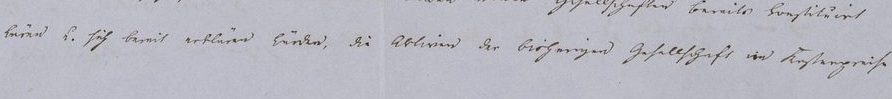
wären u. sich bereit erklären würden, die Aktiven der bisherigen Gesellschaft im Kostenpreise
